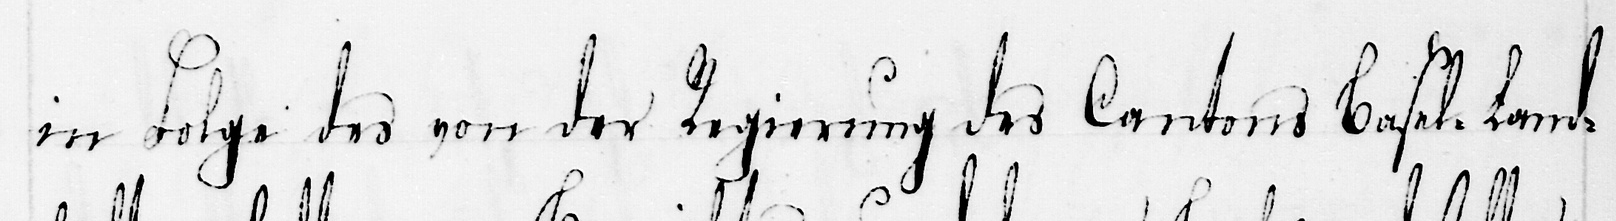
in Folge des von der Regierung des Cantons Basel-Land¬
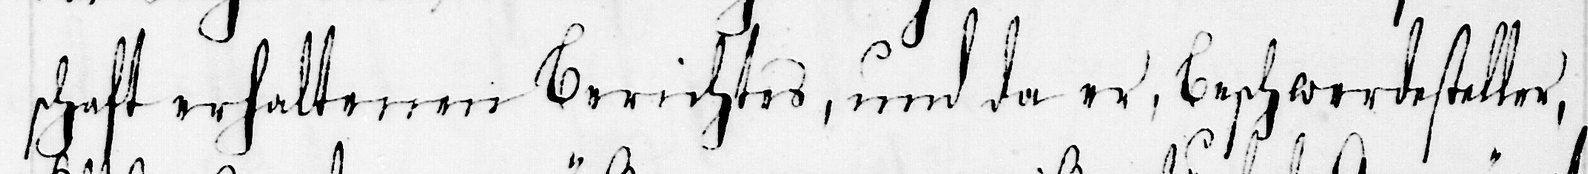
schaft erhaltenen Berichtes, und da er, Beschwerdesteller,
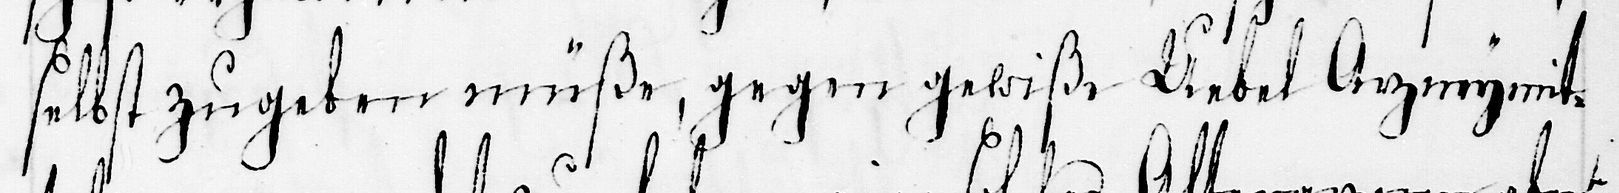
selbst zugeben müße, gegen gewiße Uebel Arzneymit¬
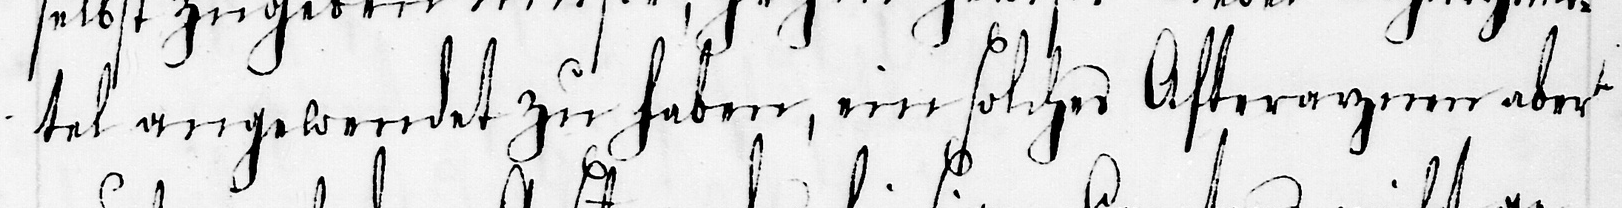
tel angewendet zu haben, ein solches Afterarznen aber
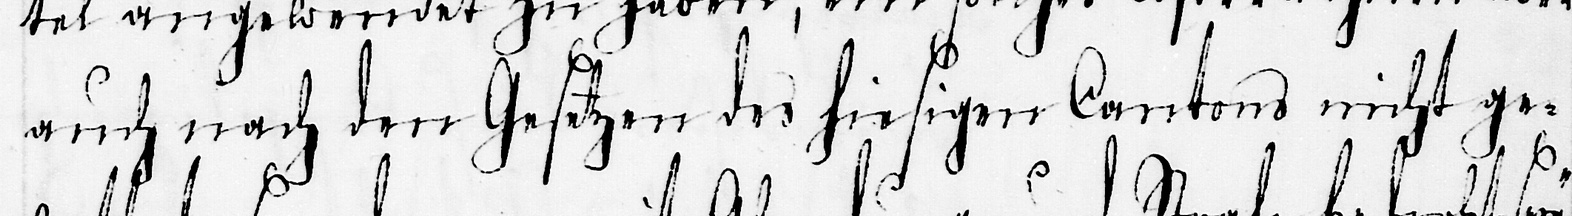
auch nach den Gesetzen des hiesigen Cantons nicht ge¬
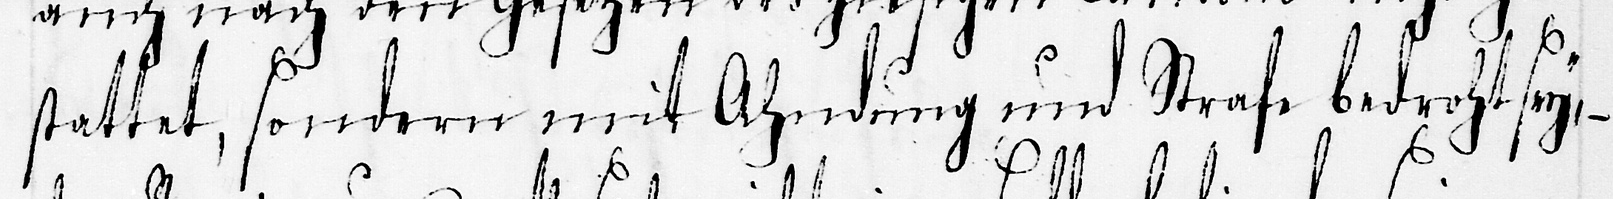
stattet, sondern mit Ahndung und Strafe bedroht sey,
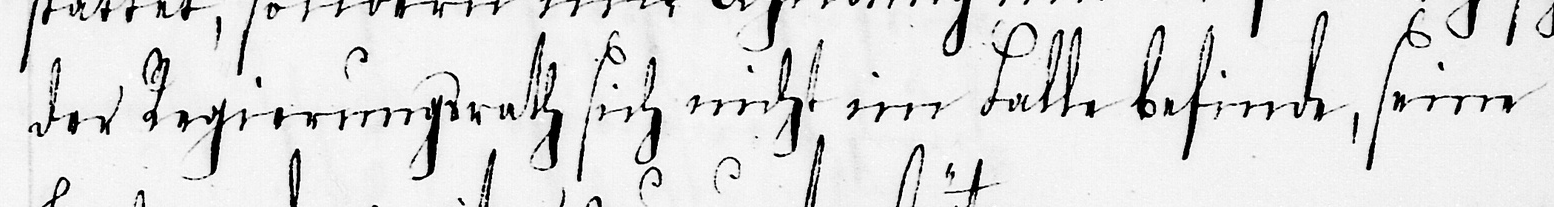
der Regierungsrath sich nicht im Falle befinde, seine
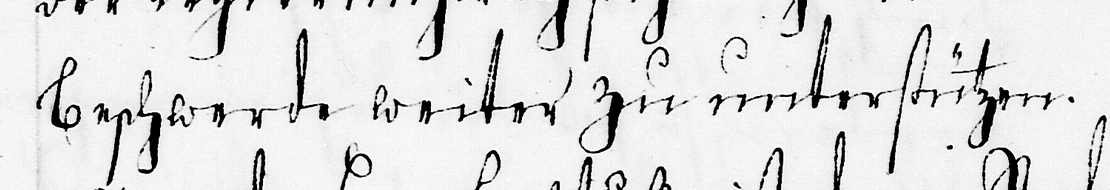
Beschwerde weiter zu unterstützen.
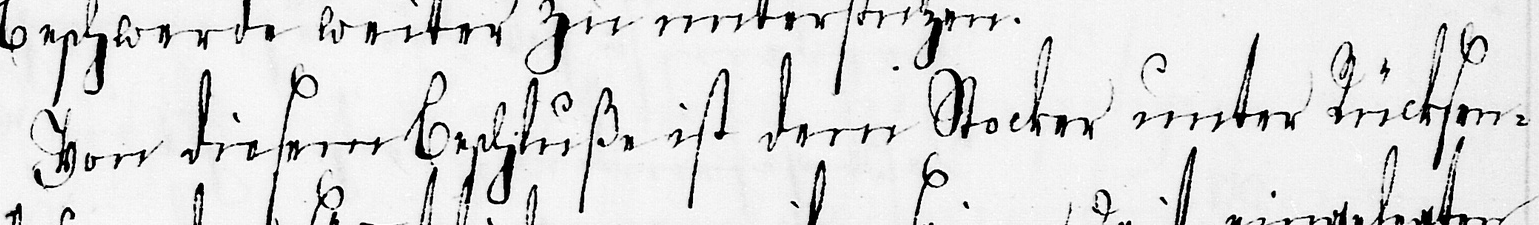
Von diesem Beschluße ist dem Stocker unter Rücksen¬
